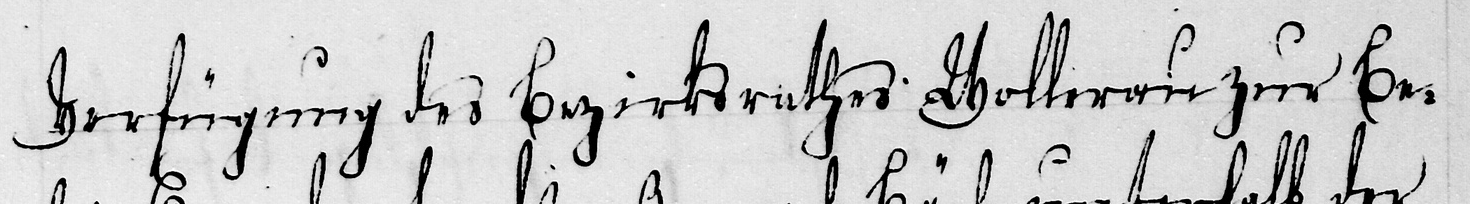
Verfügung des Bezirksrathes Wollerau zur Be¬
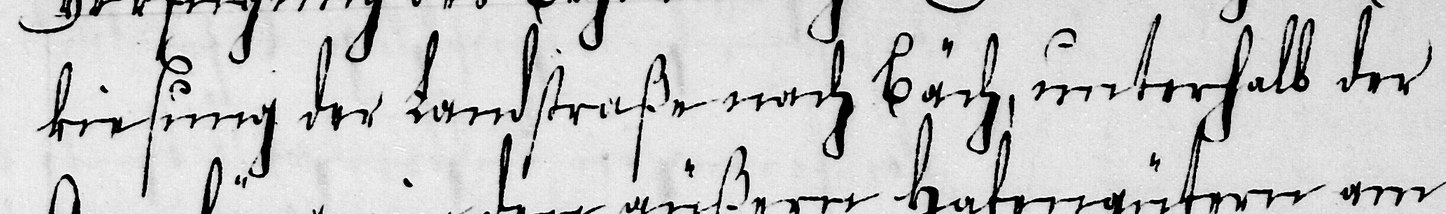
kiesung der Landstraße nach Bäch, unterhalb der
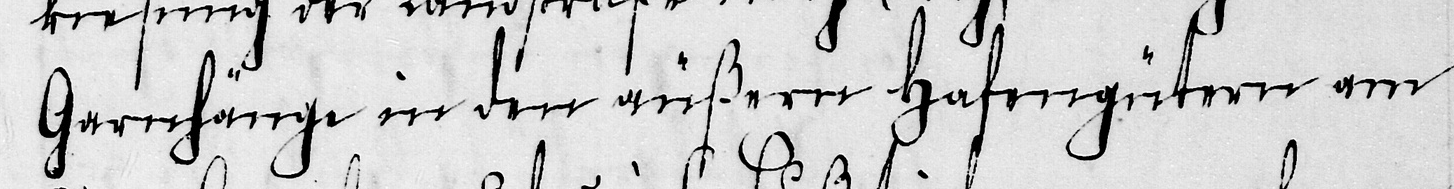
Garnhänge in den äußern Hafengütern am
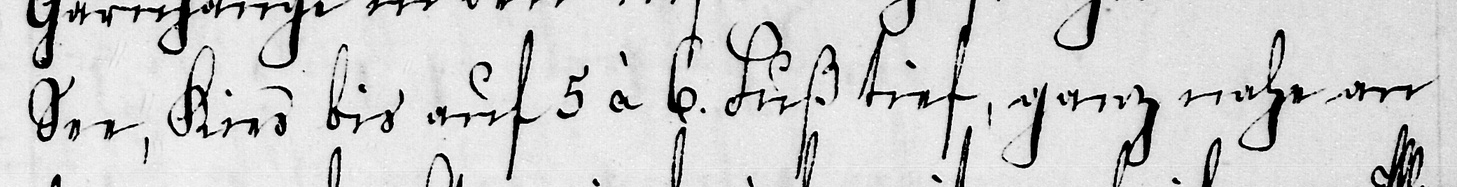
See, Kies bis auf 5 à 6. Fuß tief, ganz nahe an
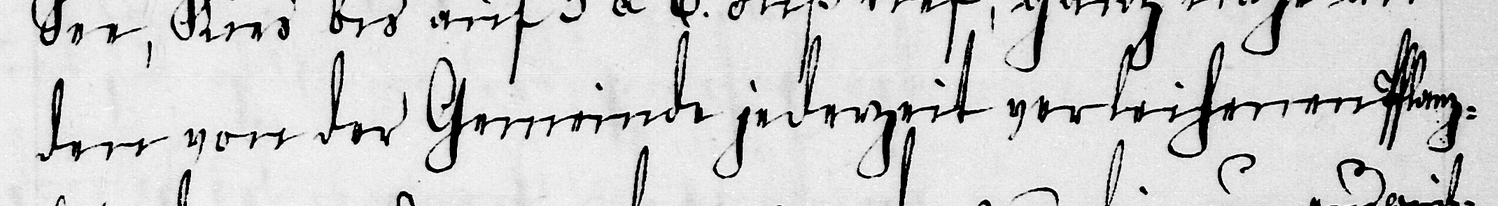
den von der Gemeinde jederzeit verleihenen Pflan¬
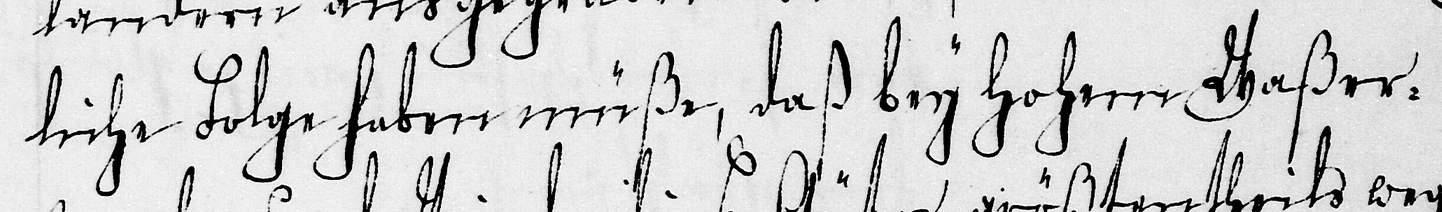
liche Folge haben müße, daß bey hohem Waßer¬
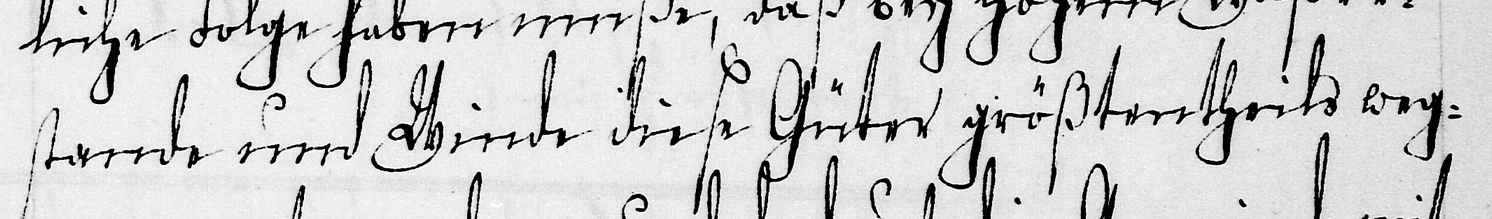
stande und Winde diese Güter größtentheils weg¬
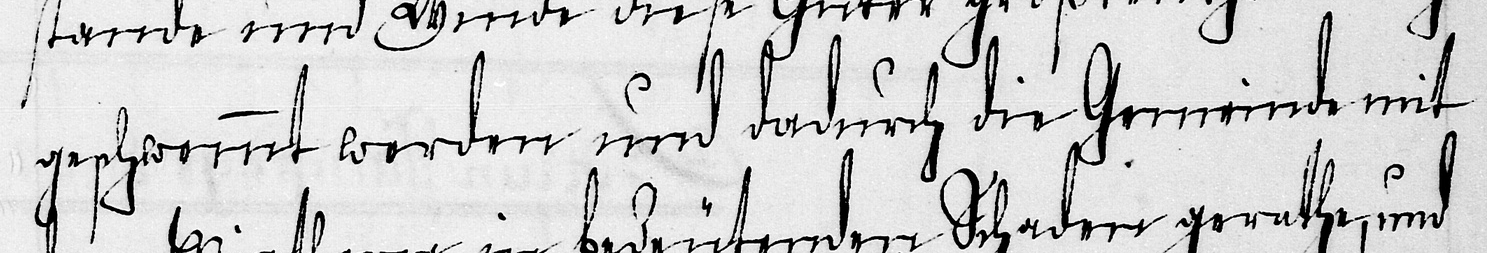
geschwemmt werden und dadurch die Gemeinde mit
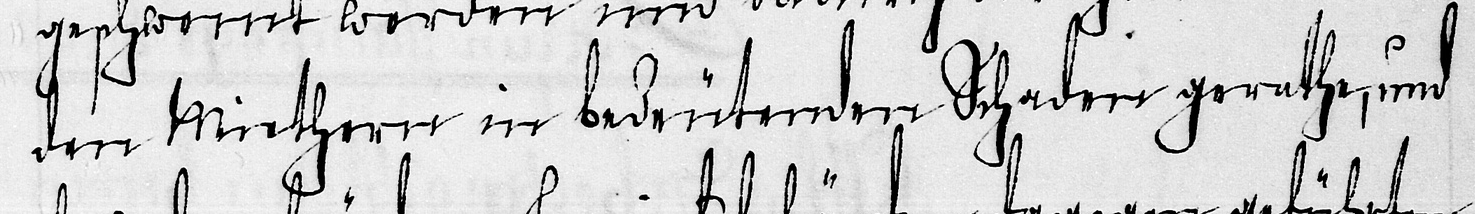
den Miethern in bedeutenden Schaden gerathe, und
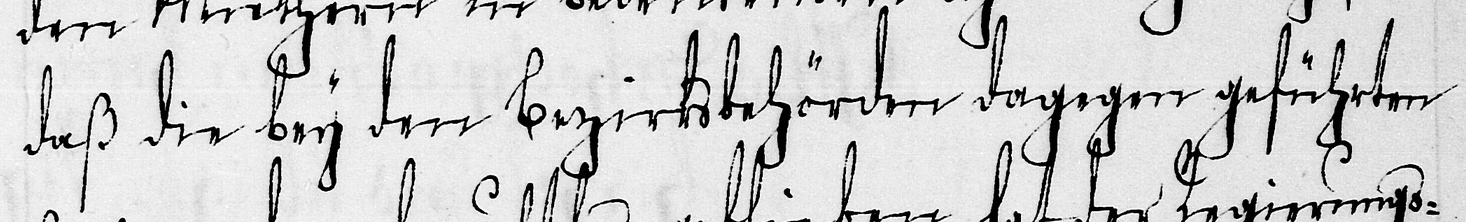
daß die bey den Bezirksbehörden dagegen geführten
